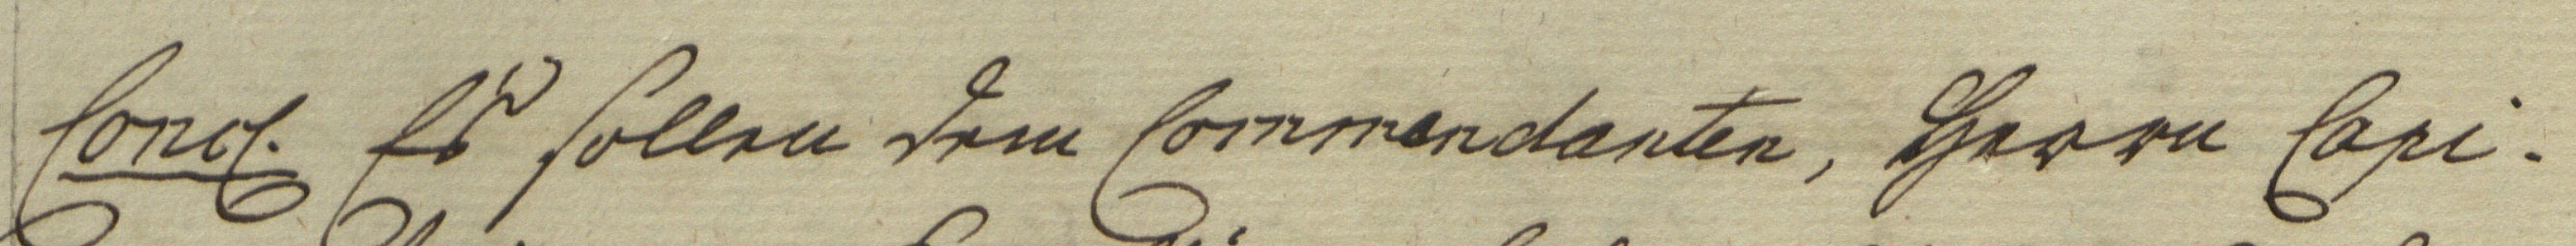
Concl. Es sollen dem Commandanten, Herrn Capi¬
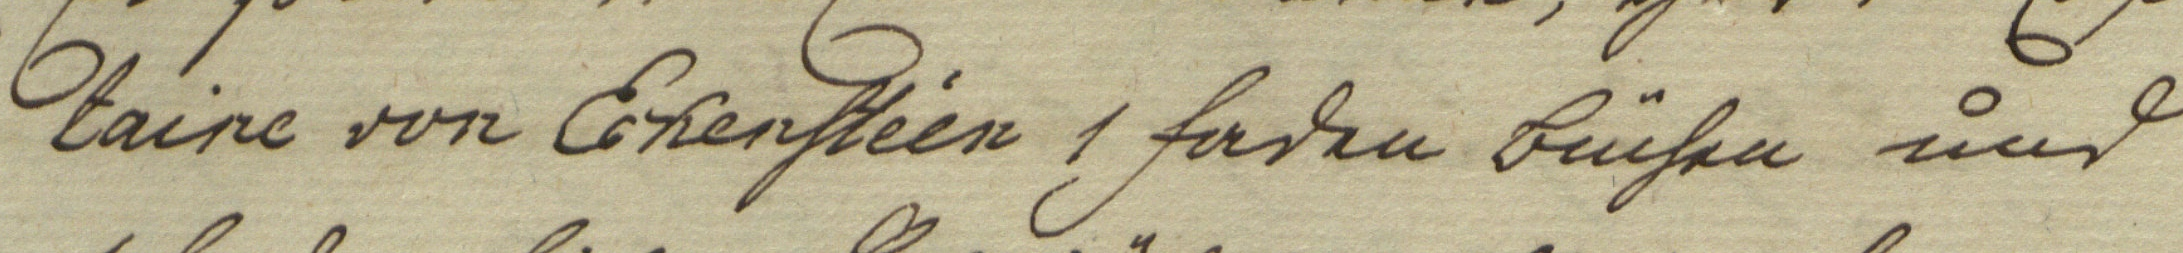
taine von Eckensteén 1 Faden Buchen und
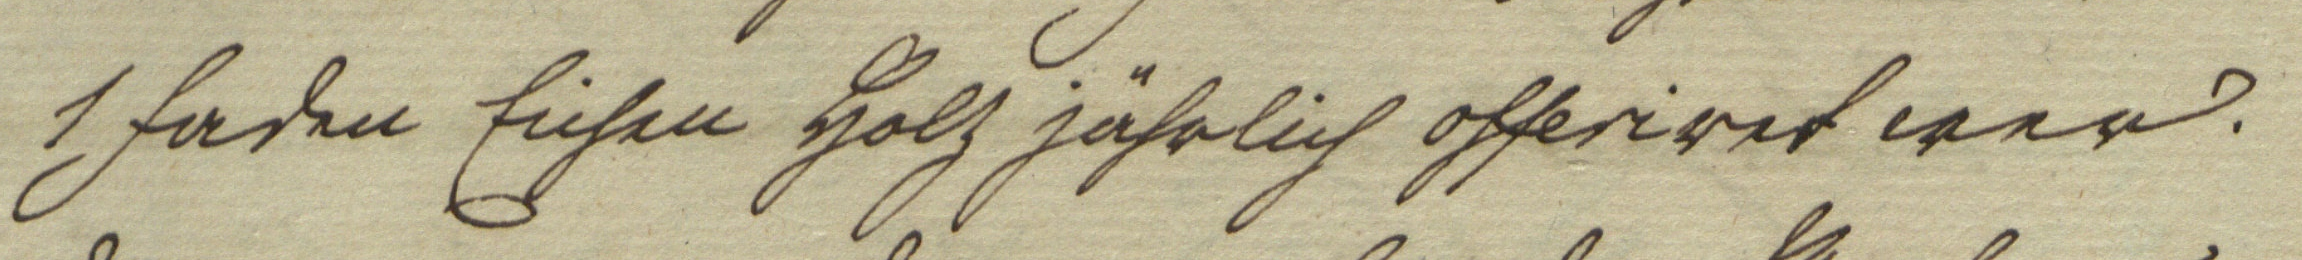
1 Faden Eichen Holz jährlich offeriret wer¬
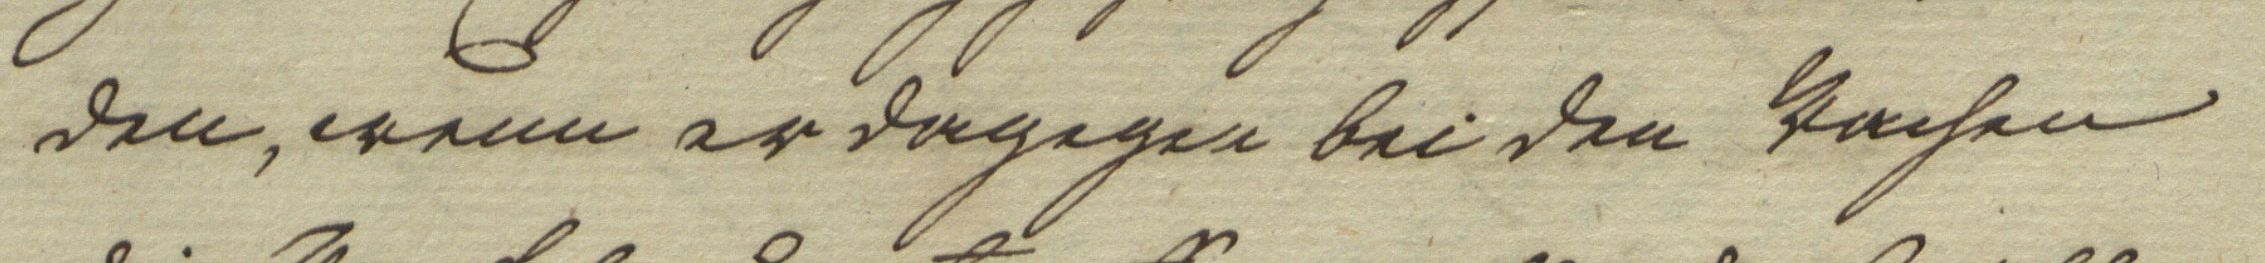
den, wenn er dagegen bei den Wachen
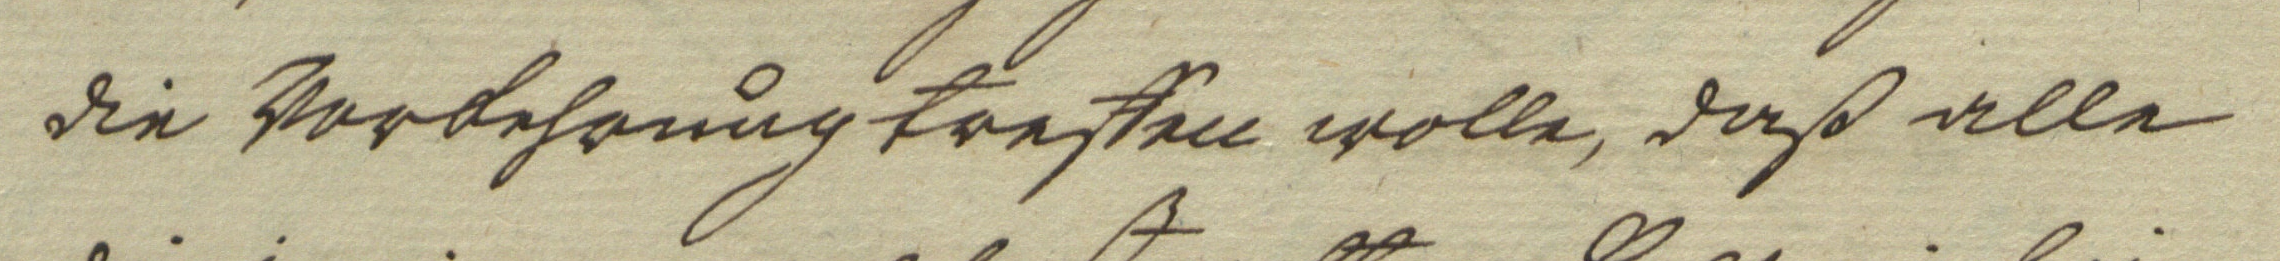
die Vorkehrung treffen wolle, daß alle
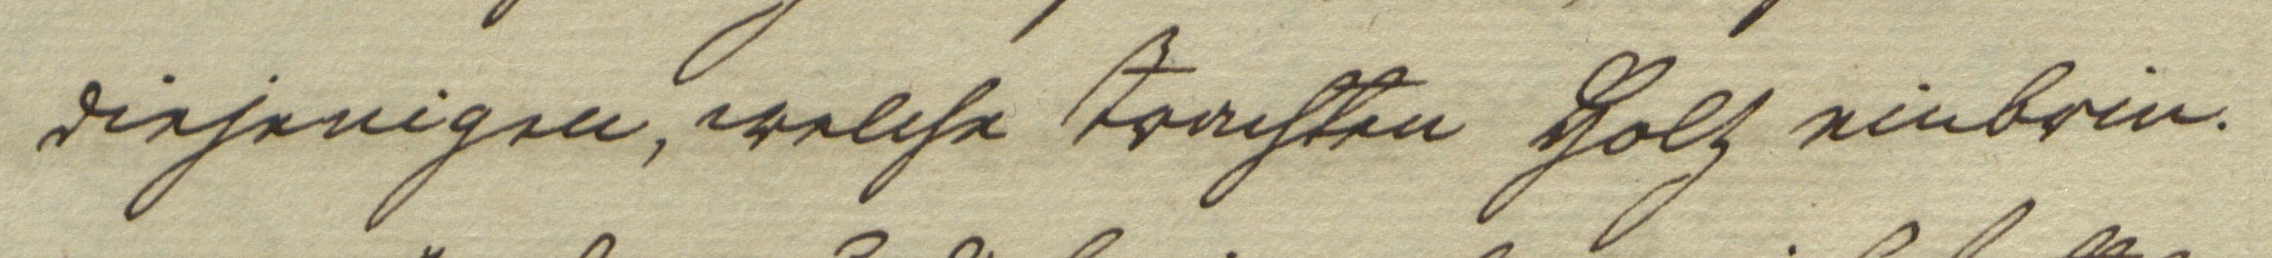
diejenigen, welche Trachten Holz einbrin¬
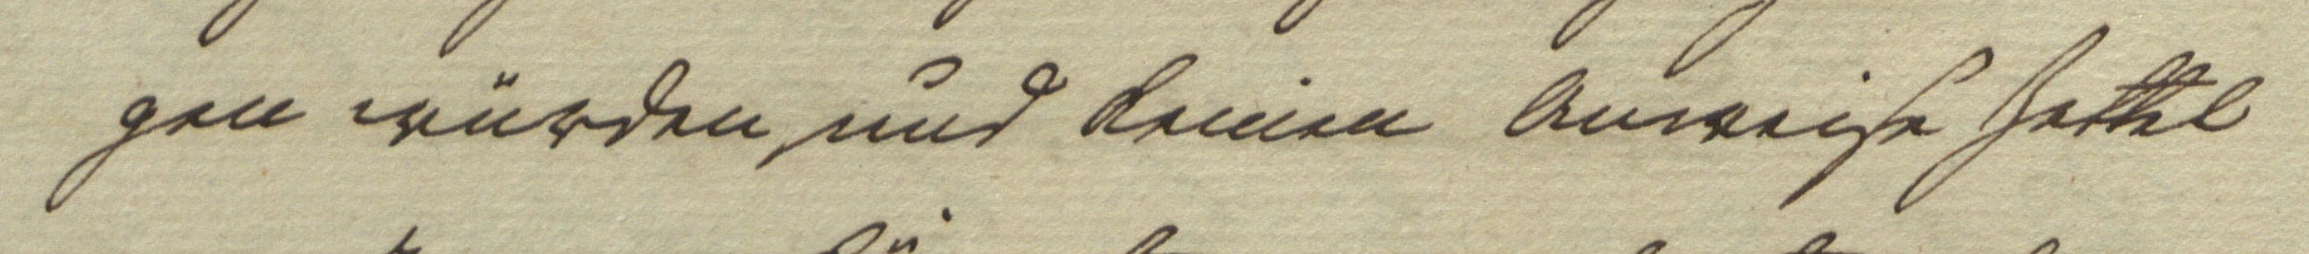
gen würden und keinen Anweise Zettel
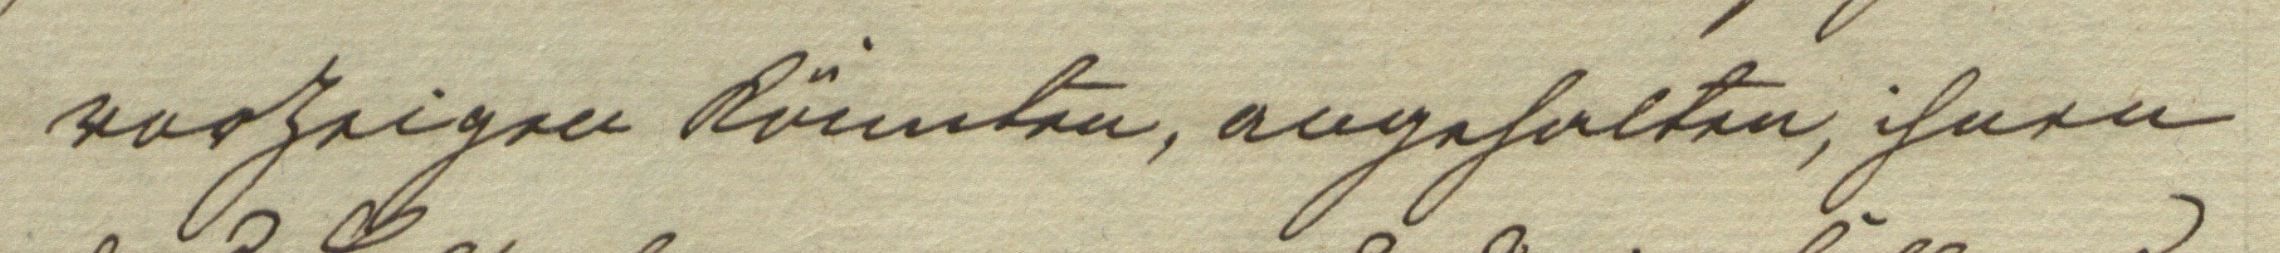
vorzeigen könnten, angehalten, ihnen
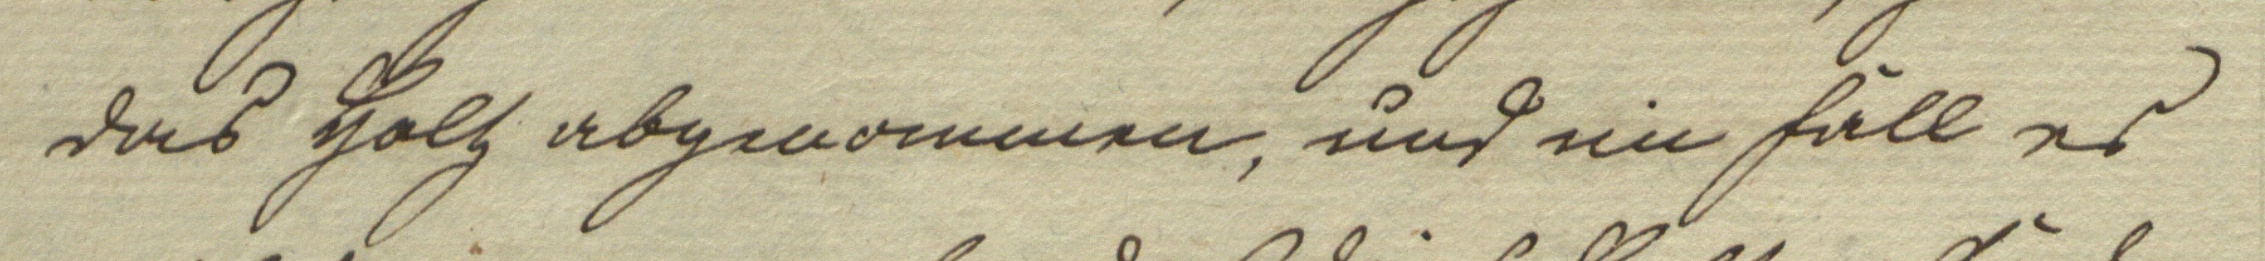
das Holz abgenommen, und im Fall es
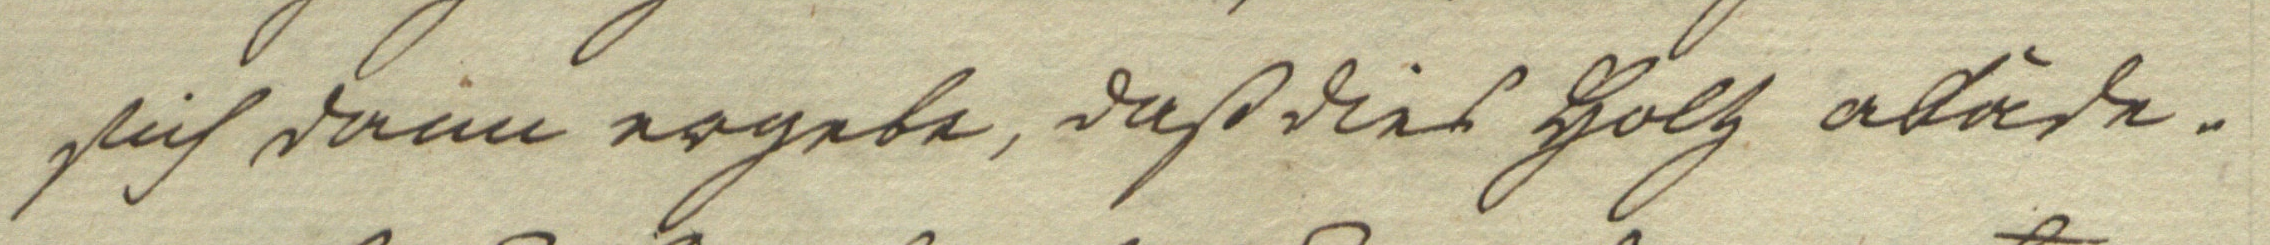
sich dann ergebe, daß dies Holz akade¬
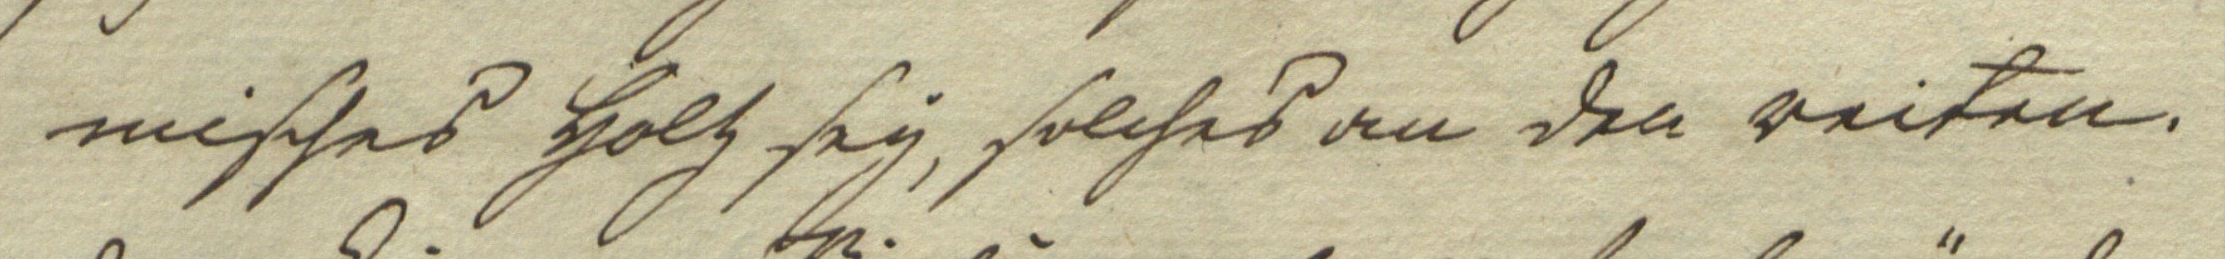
misches Holz seÿ, solches an den reiten¬
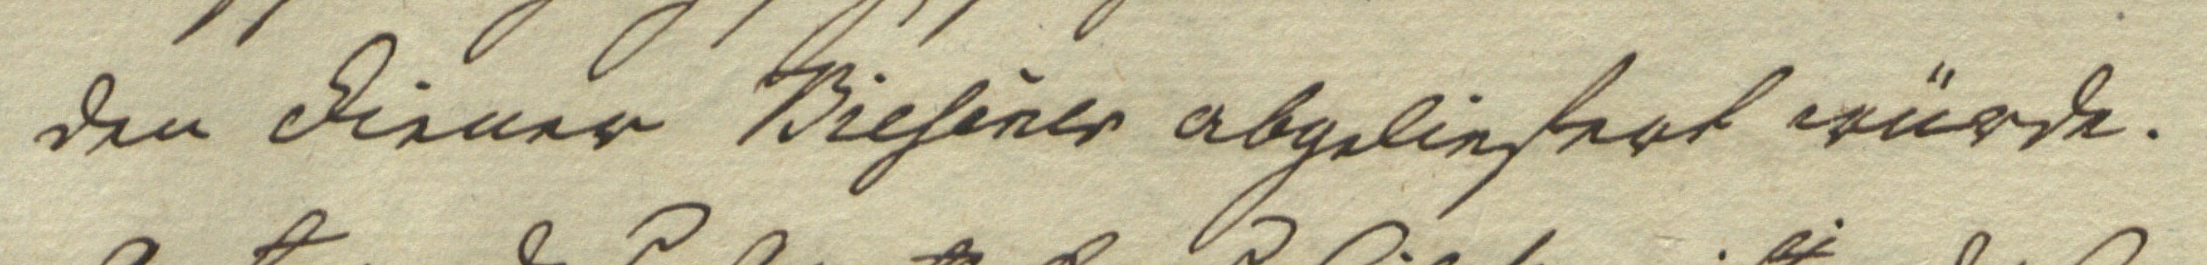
den Diener Biesener abgeliefert würde.
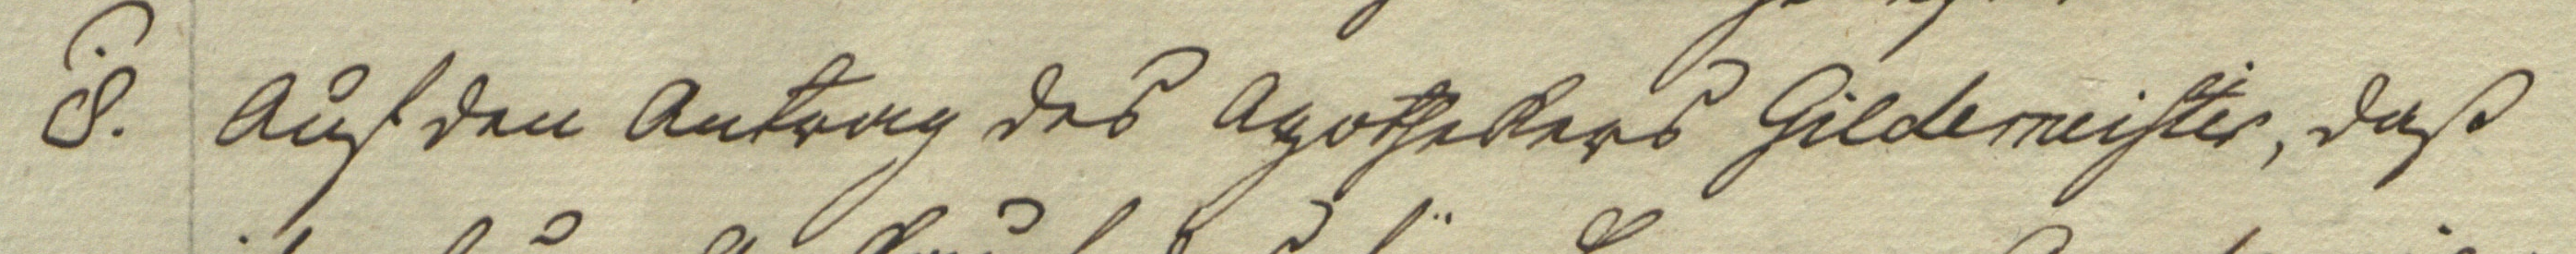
8. Auf den Antrag des Apothekers Gildemeister, daß
